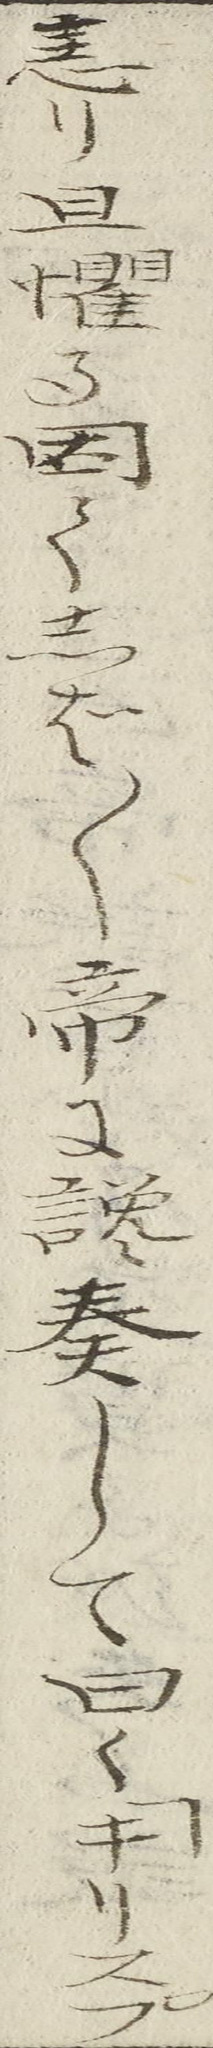恚り且懼る因てしば〳〵帝に讒訴して曰く「キリスプ
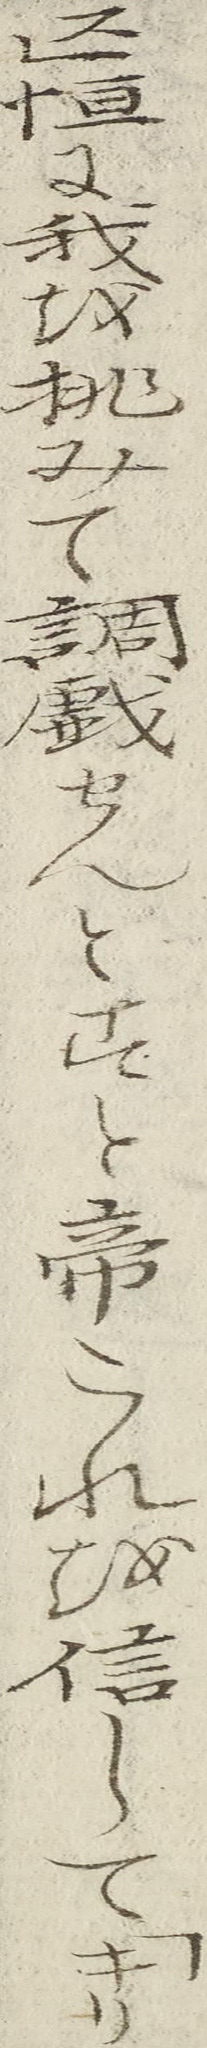ス」恒に我を挑みて調戯せんとす帝これを信して「キリ
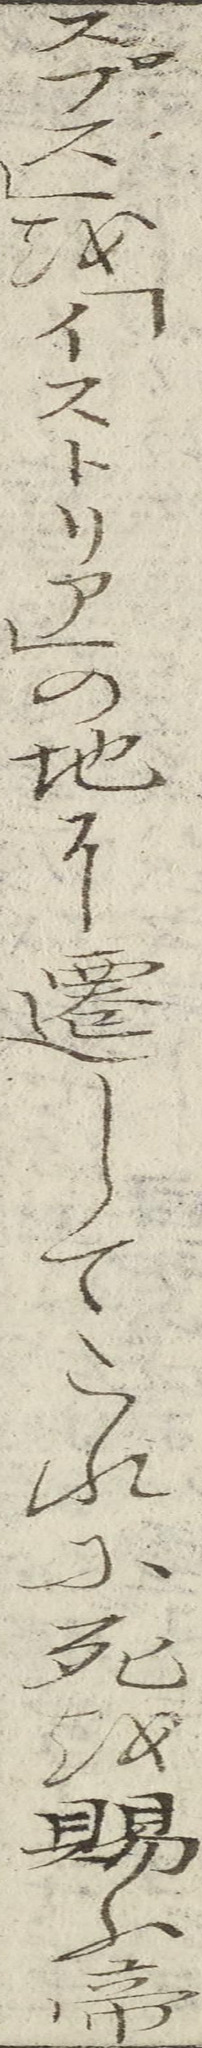スプス」を「イストリア」の地に遷してこれに死を賜ふ帝
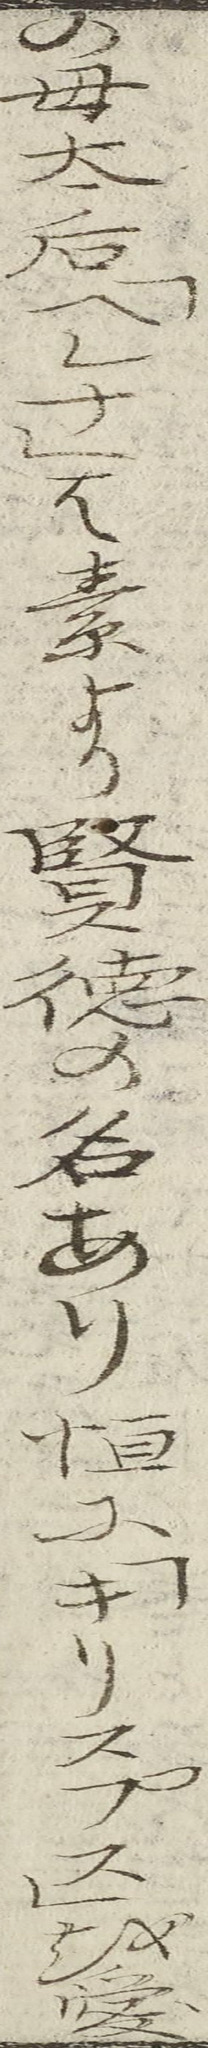の母「ヘレナ」は素より賢徳の名あり恒に「キリスプス」を愛
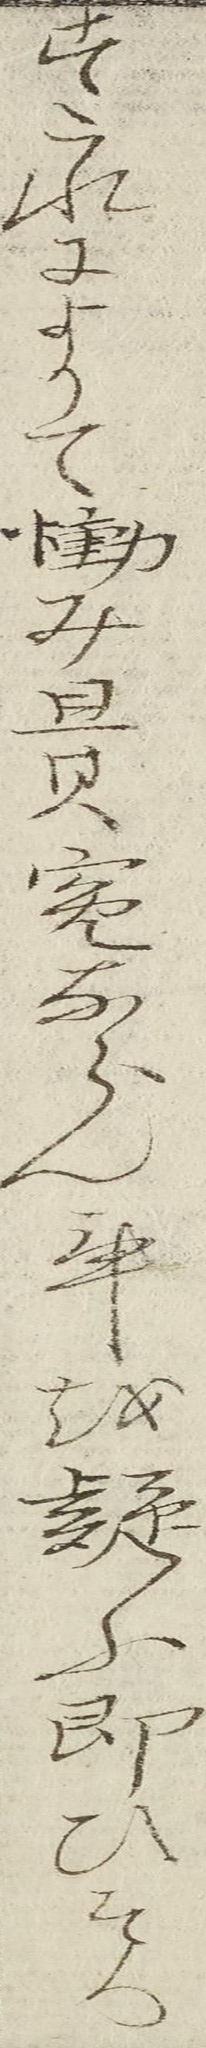すこれによりて慟み且其寃ならん事を疑ふ即ひそか
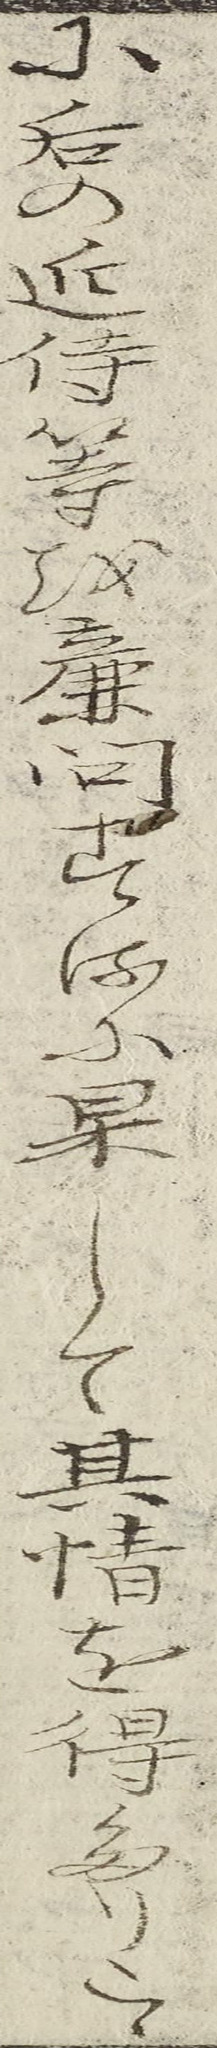に后の近侍等を廉問するに果して其情を得たりこゝ
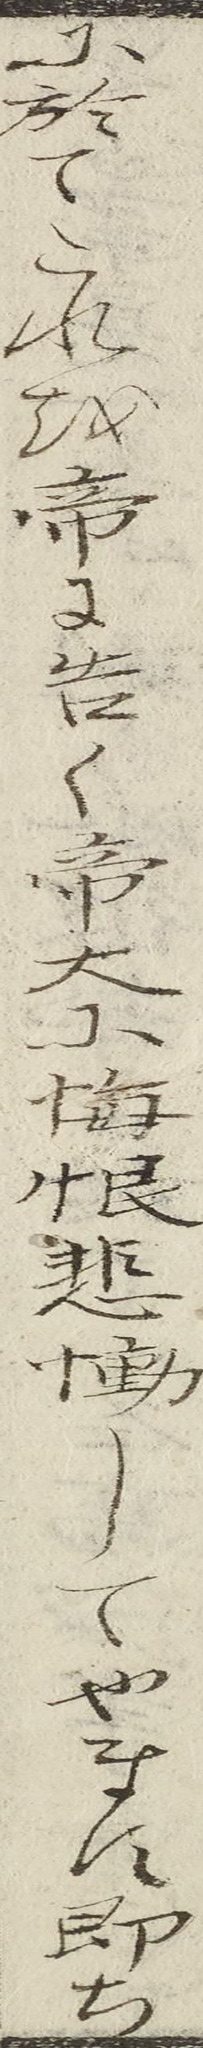に於てこれを帝に告く帝大に悔恨悲慟してやます即ち
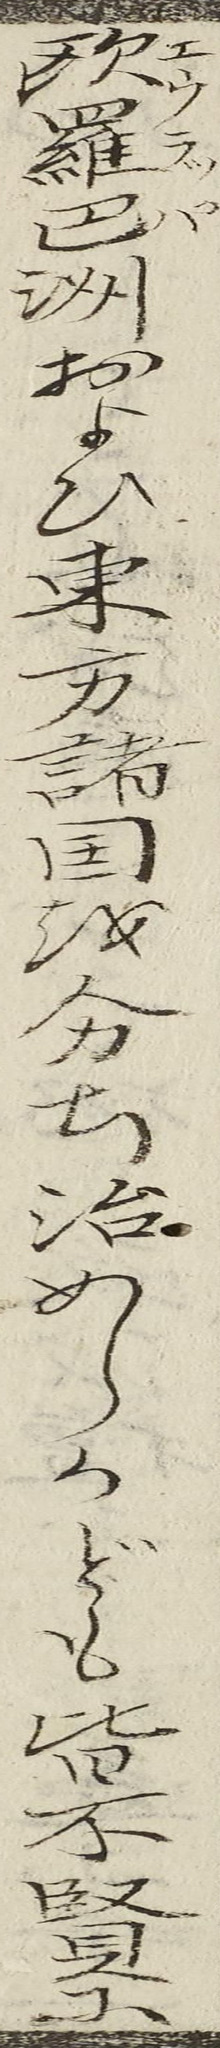欧羅巴州およひ東方諸国を分ち治めしかども皆不賢に
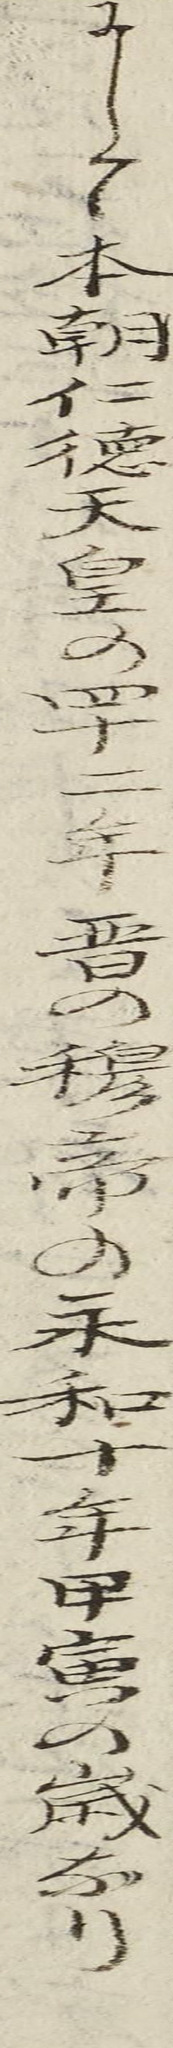にして本朝仁徳天皇の四十二年晋の穆帝の永和十年甲寅の年也なり
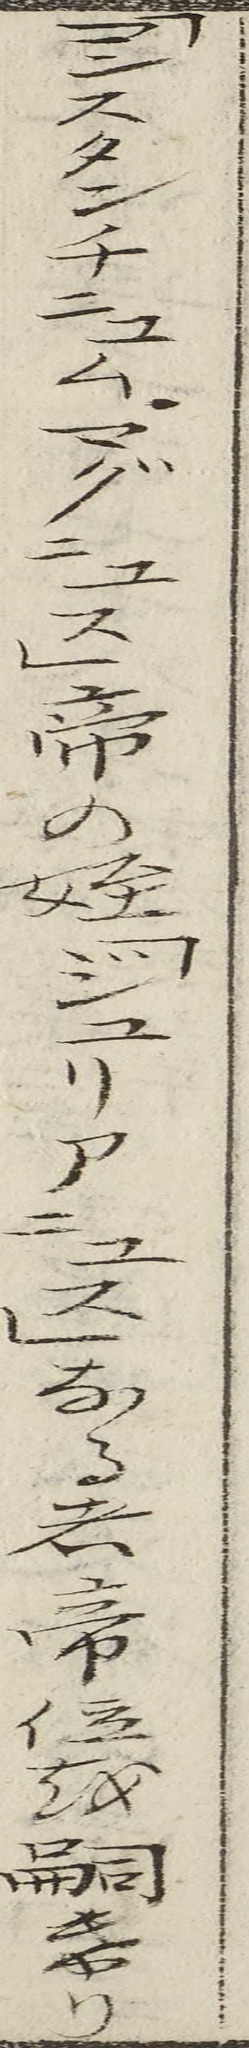「コンスタンチ二ユム．マグ二ユス」帝の姪「ジュリア二ュス」なる者帝位を嗣けり
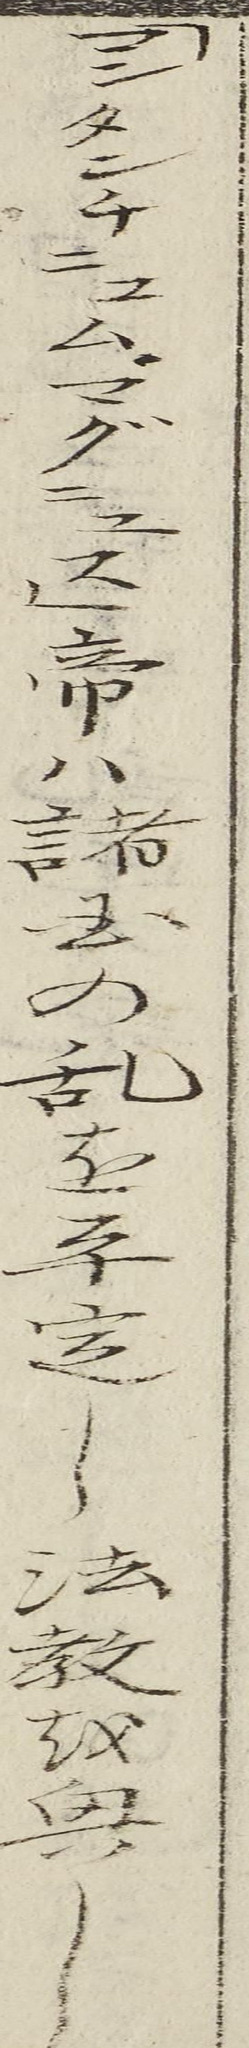「コンスタンチ二ユム．マグ二ユス」帝は諸国の乱を平定し法教を興し
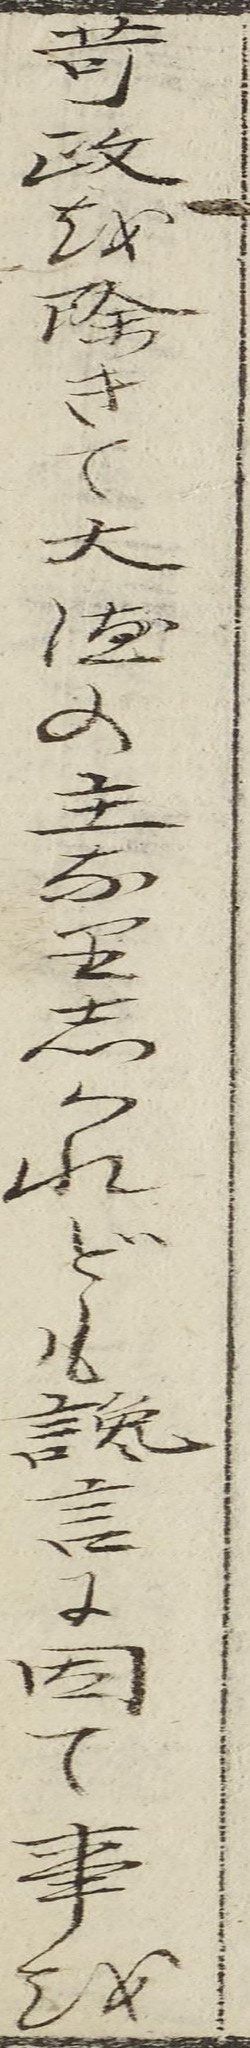苛政を除きて大陸の主なりしかれとも讒言に因て事を

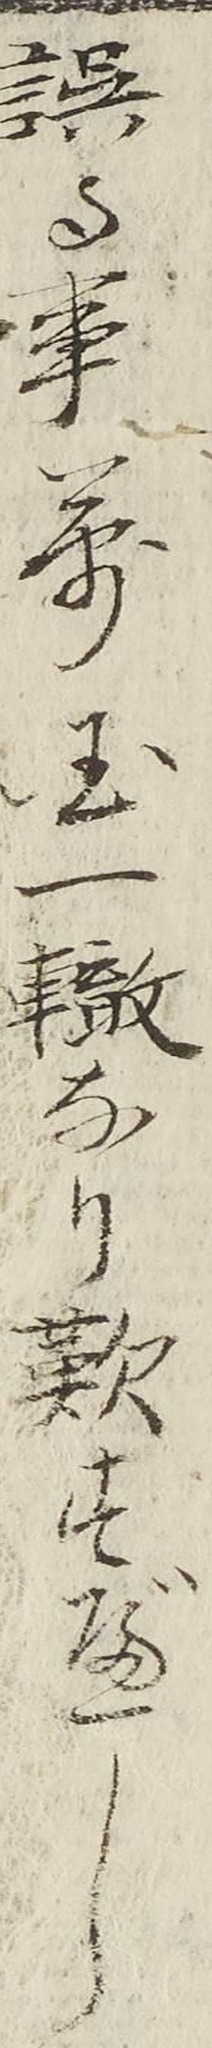誤る事万国一轍なり歎すべし
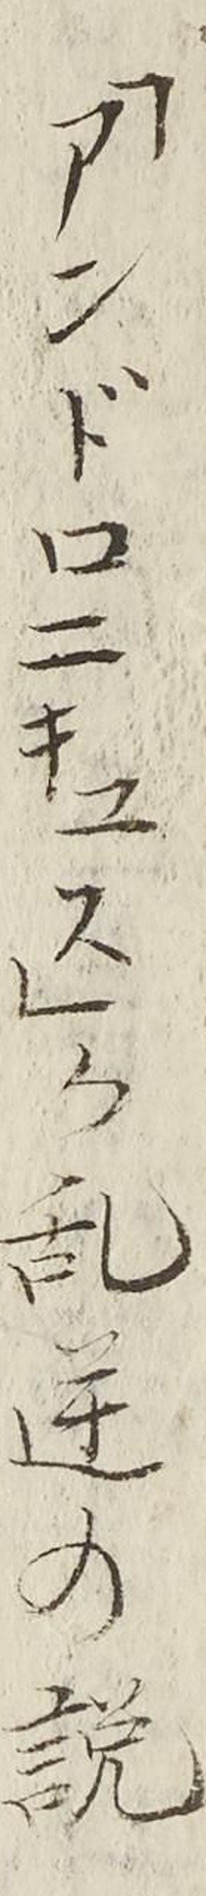「アンドロ二キュス」か乱逆の説
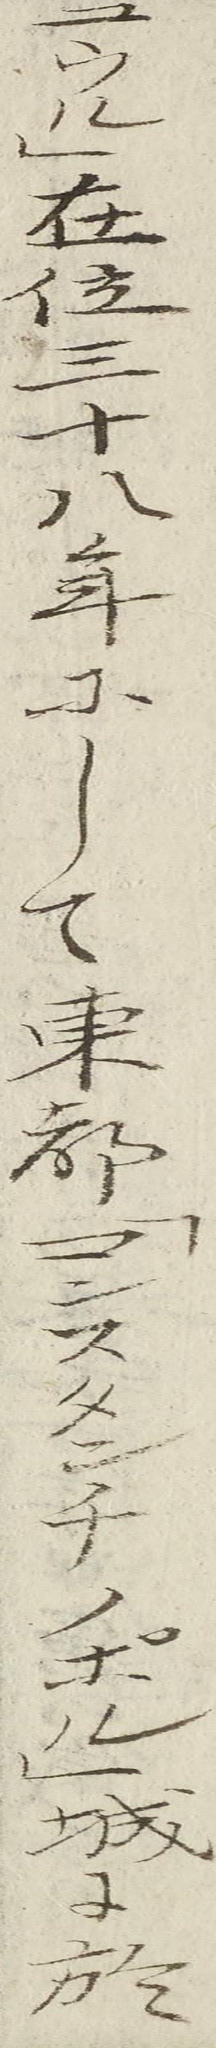ュウル」在位三十八年にして東都「コンスタンチンノポル」城に於
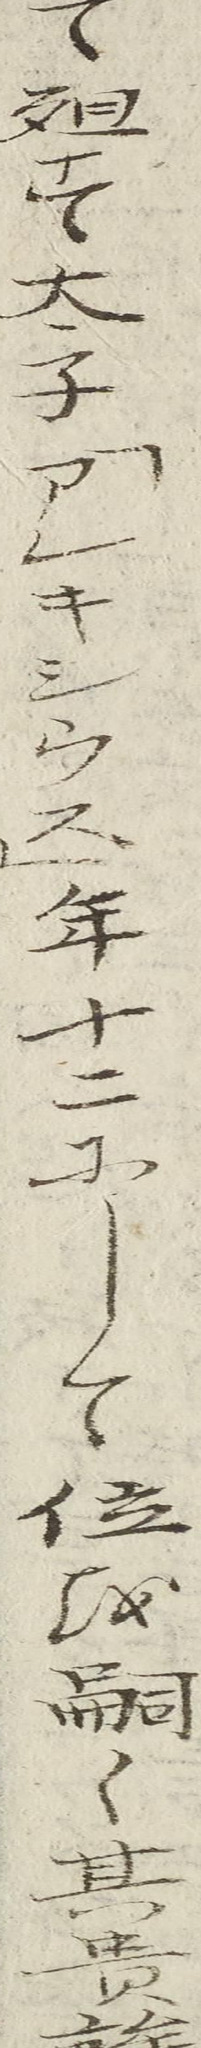て殂す太子「アレキシウス」年十二にして位を嗣く其貴族
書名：西洋雜記　乾
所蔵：東京大学地震研究所図書室 Earthquake Research Institute Library, The University of Tokyo, JAPAN
